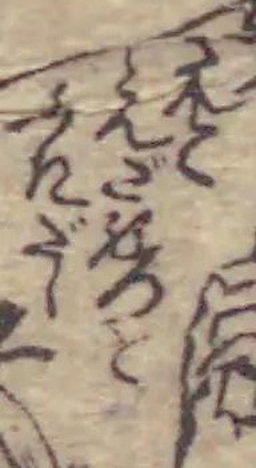ふきだし
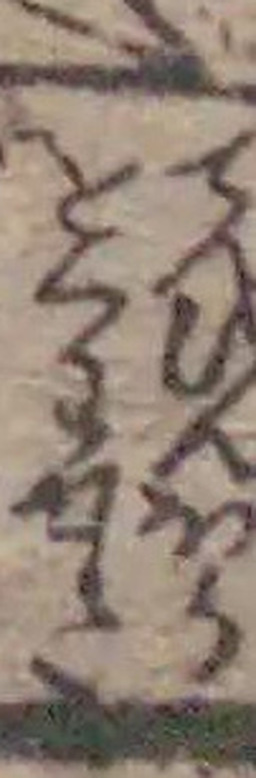をくわせた
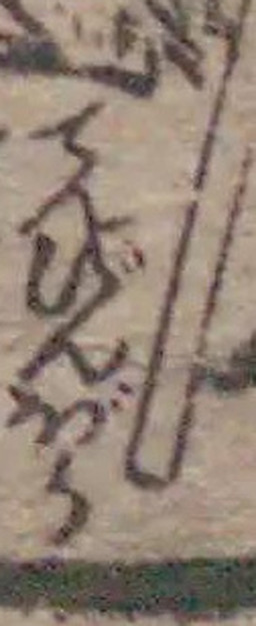てんびんぼう
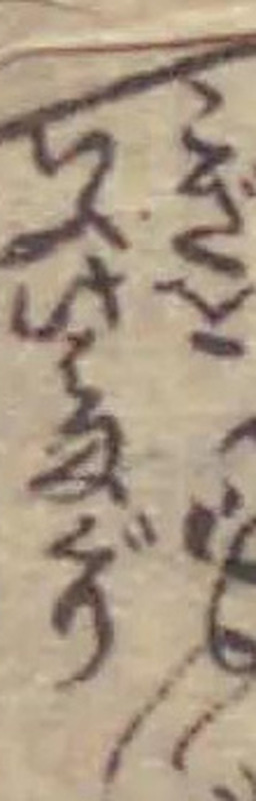いふ此はまぐり
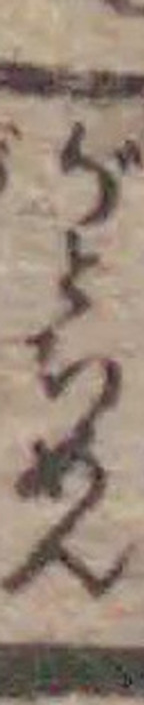がとちめん
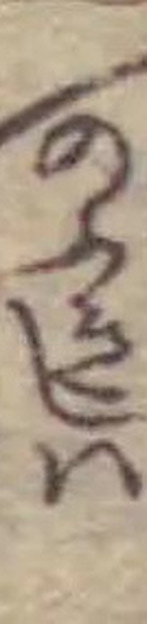のふきしは
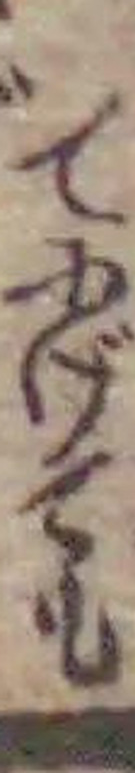てにげても
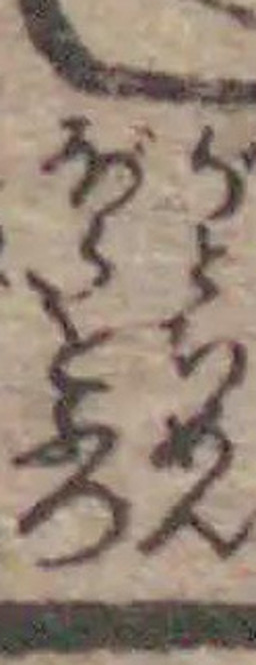ぼうをふつ
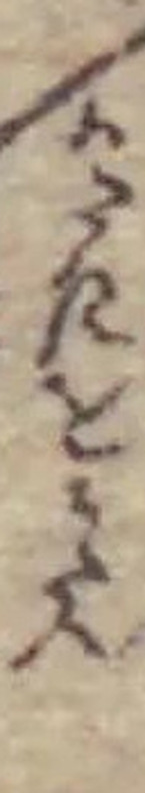かたきをうたん
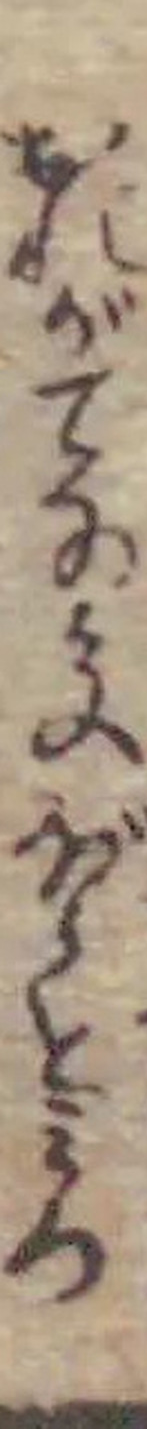おれがてなみにぼうをみろ
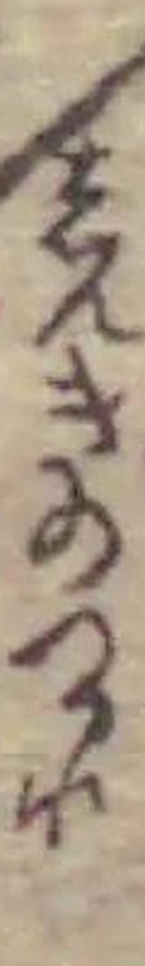しんきのつかれ
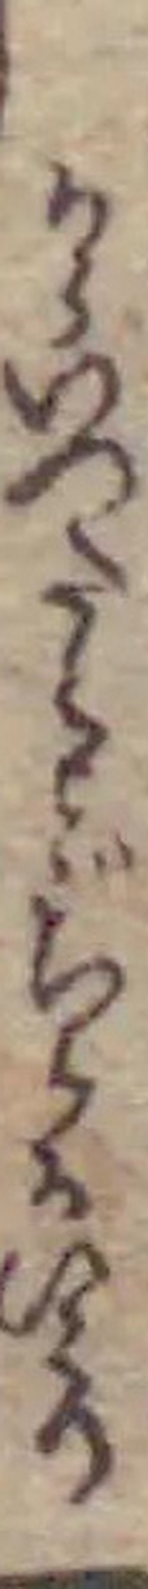かういつたらばちかひうり
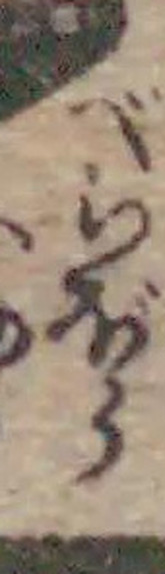べらぼう
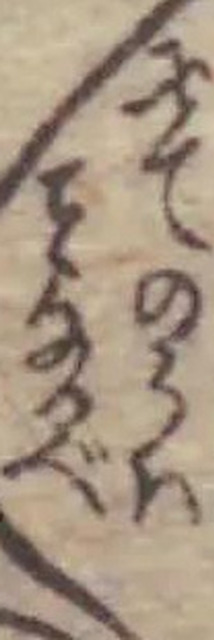ことなるべ
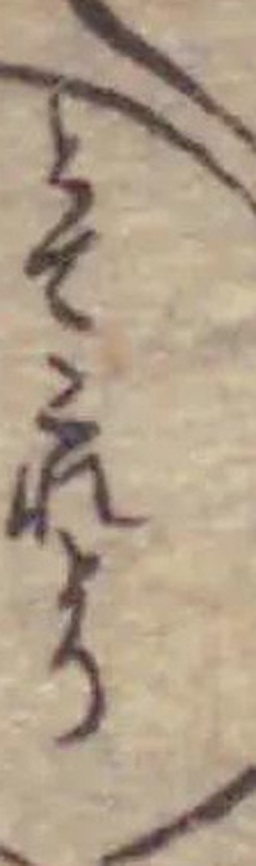しとてこれより
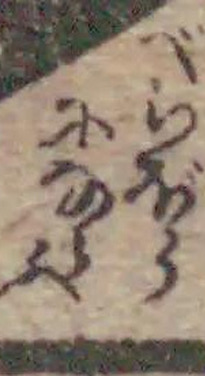にならふ
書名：冷水灰毛猫 2巻
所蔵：国立国会図書館 National Diet Library, JAPAN
